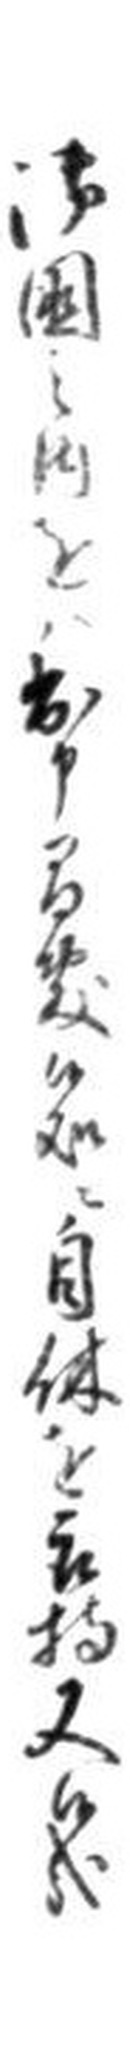御国之内をハ出申間敷候処ニ自休を取持又候哉
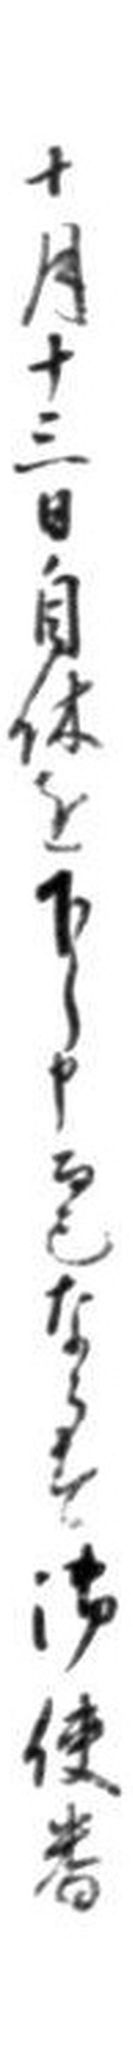十月十三日自休を下し申而已ならす御使番
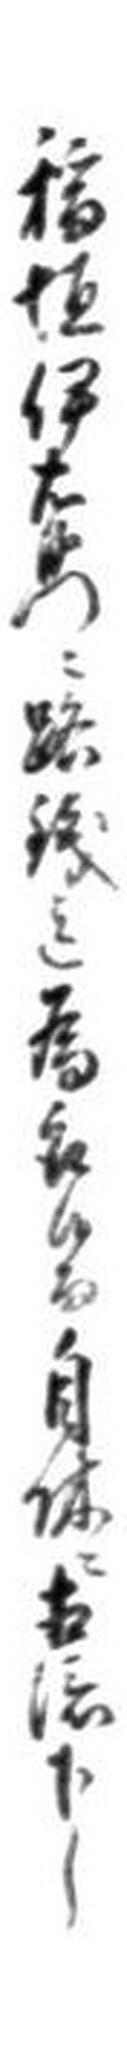稲垣伊右衛門ニ路銭迄為取候而自休ニ相添下し
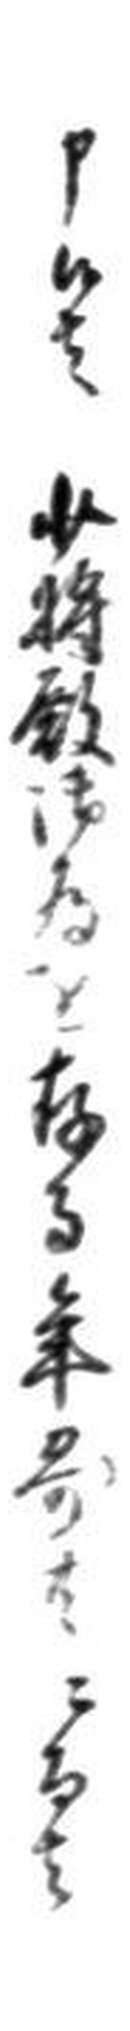申候者少将殿御為を存る年寄共ニ而者
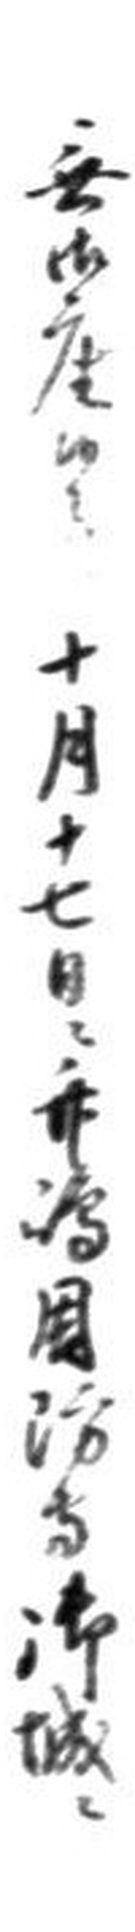無御座候て十月十七日ニ竹嶋周防守御城ニ
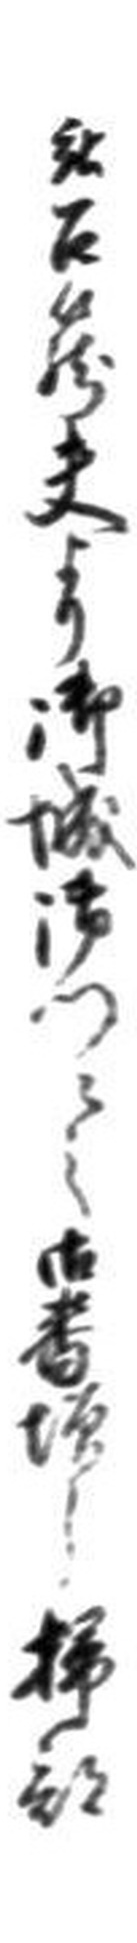被召籠夫より御城御門々之御番増し掃部
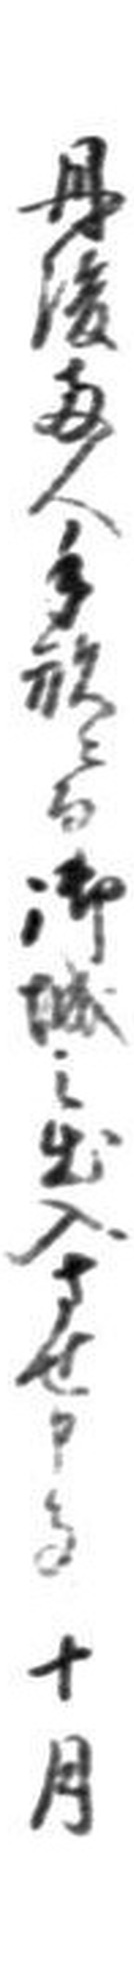丹後両人手形ニ而御城之出入させ申事十月
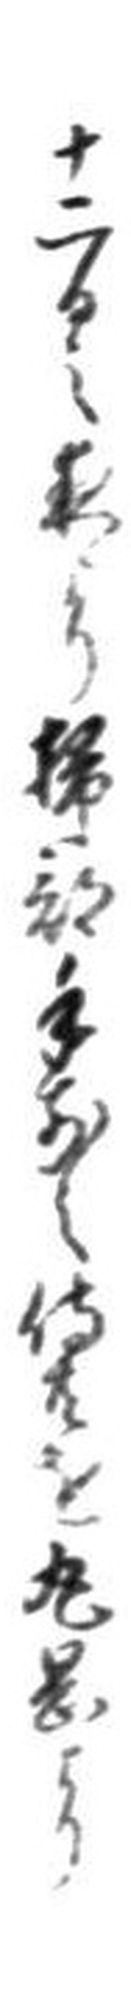十二日之夜より掃部手前之侍共を丸岡より
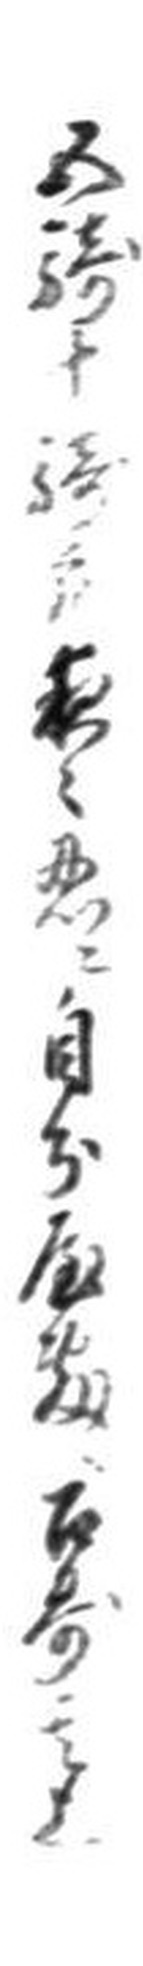五騎十騎宛夜々忍ニ自分屋敷へ召寄其上
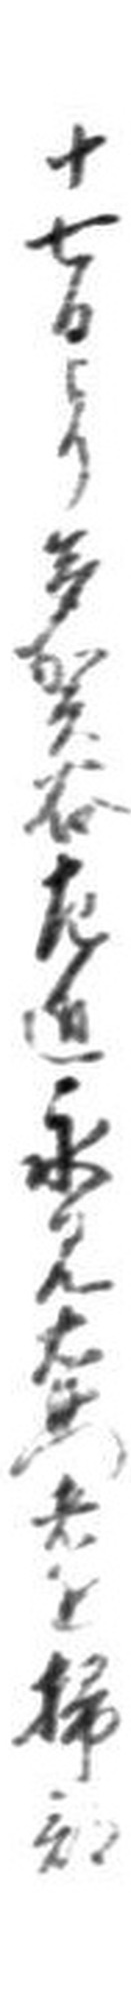十七日より多賀谷左近永見右衛門老を掃部
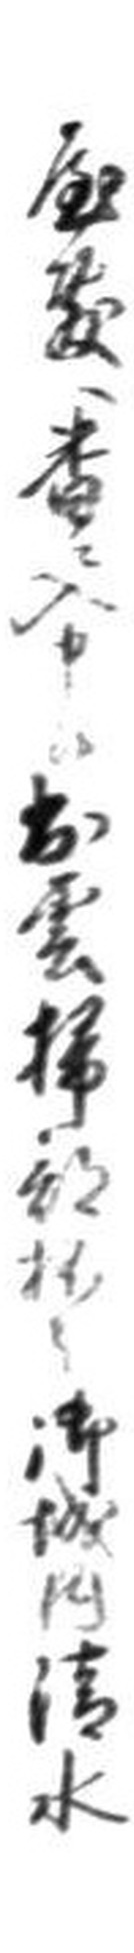屋敷へ番ニ入申候出雲掃部抔者御城内清水
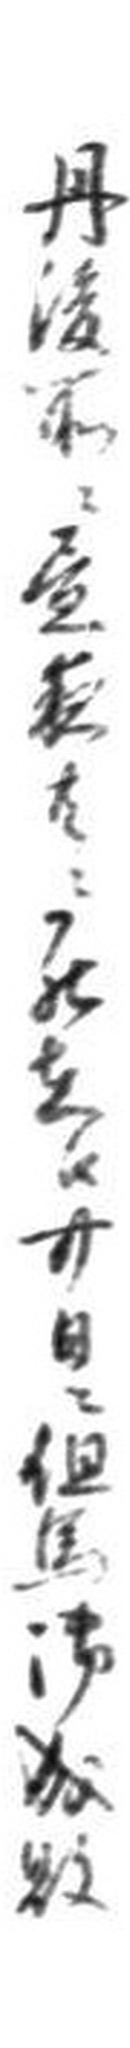丹後所ニ昼夜共ニ罷在由廿日ニ但馬御成敗

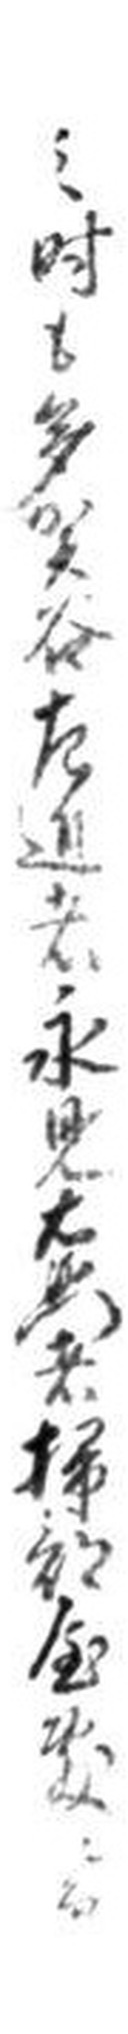之時も多賀谷左近老永見右衛門老掃部屋敷ニ而
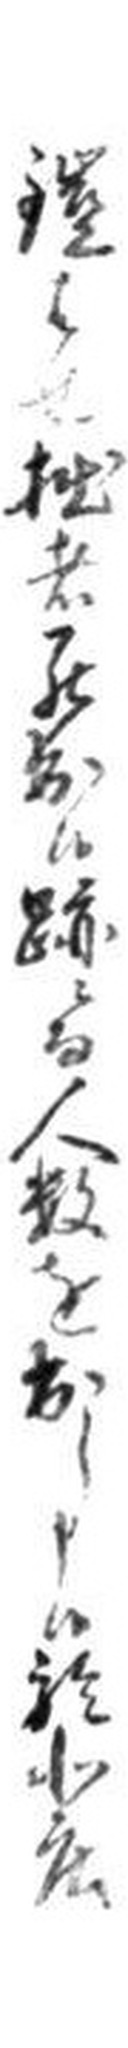鎧はせ拙者罷出候跡ニ而人数を出し申候於北庄
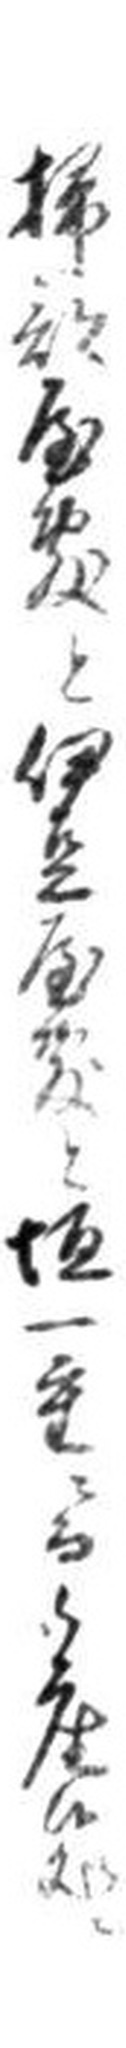掃部屋敷と伊豆屋敷と垣一重ニ而御座候処ニ
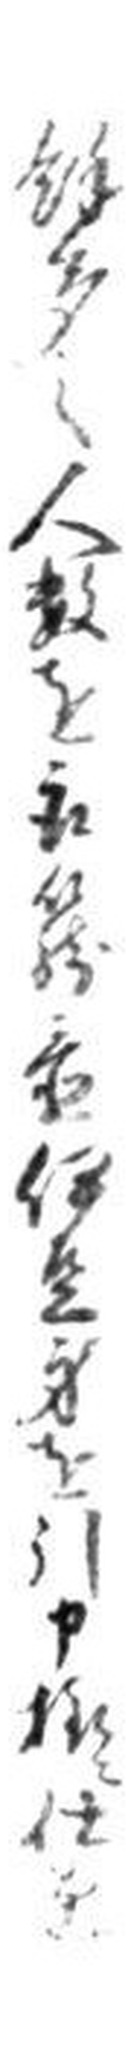余多之人数を取籠置伊豆身を引申様ニ仕
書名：家譜 二 忠直公 従文禄四年到慶安四年
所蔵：福井県文書館 Fukui Prefectural Archives
